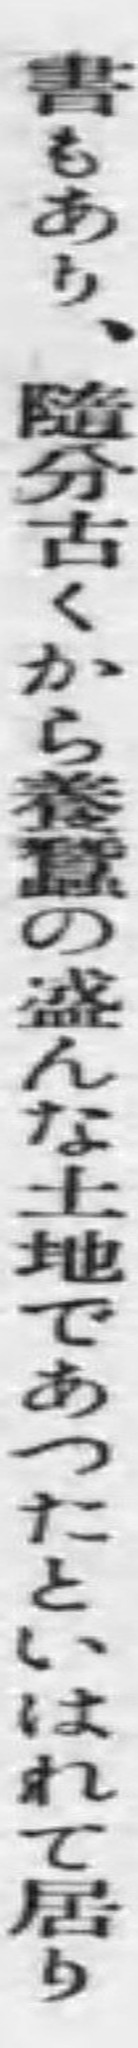書もあり、随分古くから養蠶の盛んな土地であつたといはれて居り
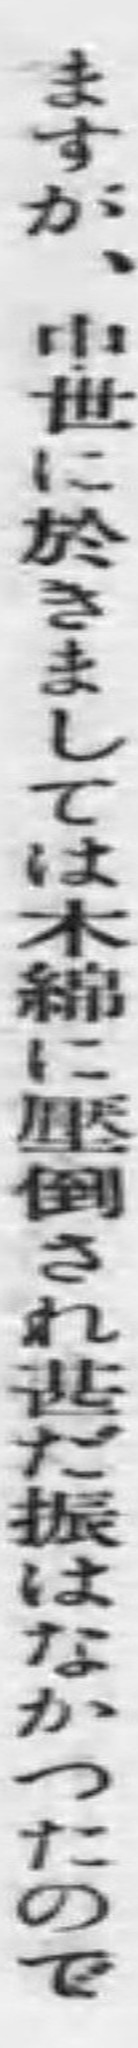ますが、中世に於きましては木綿に壓倒され甚だ振はなかつたので
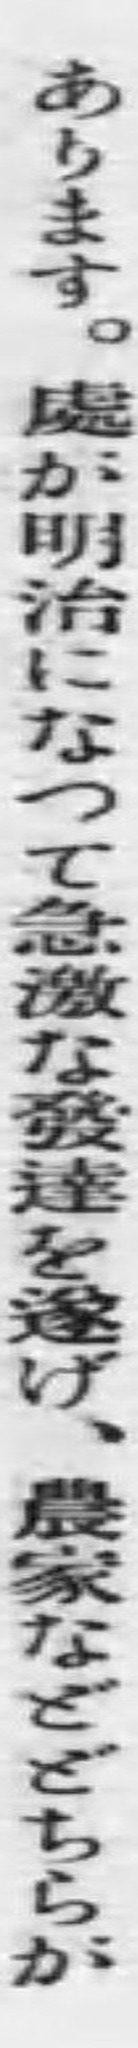あります。處が明治になつて急激な發達を遂げ、農家などどちらが
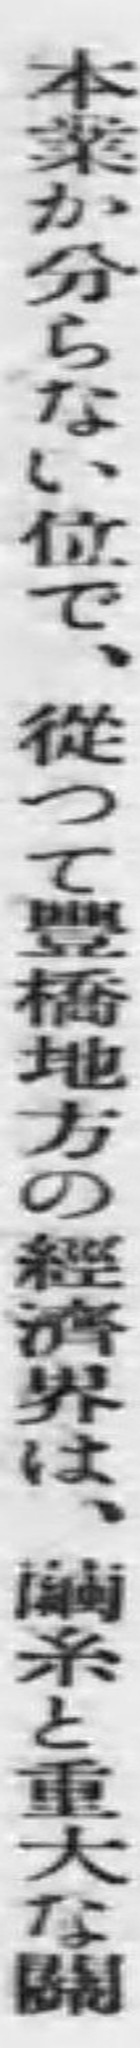本業か分らない位で、従つて豊橋地方の経済界は、繭糸と重大な關
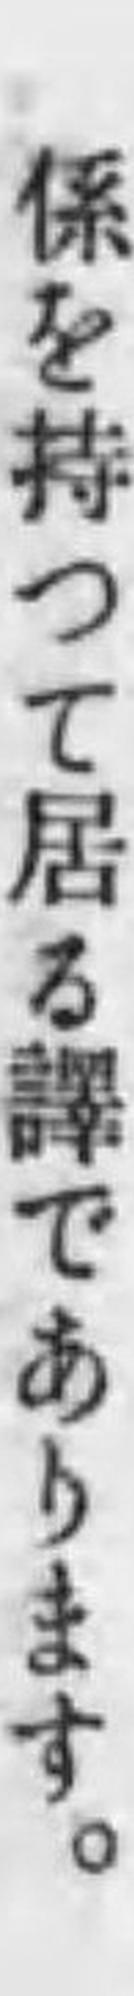係を持つて居る譯であります。
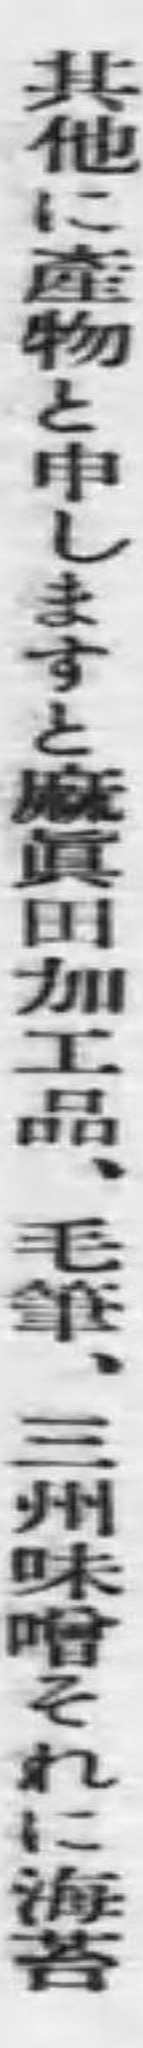其他に産物と申しますと麻眞田加工品、毛筆、三州味噌それに海苔
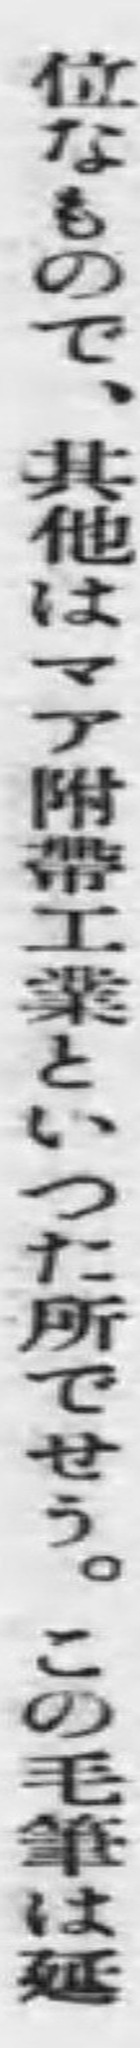位なもので、其他はマア附帯工業といつた所でせう。この毛筆は延
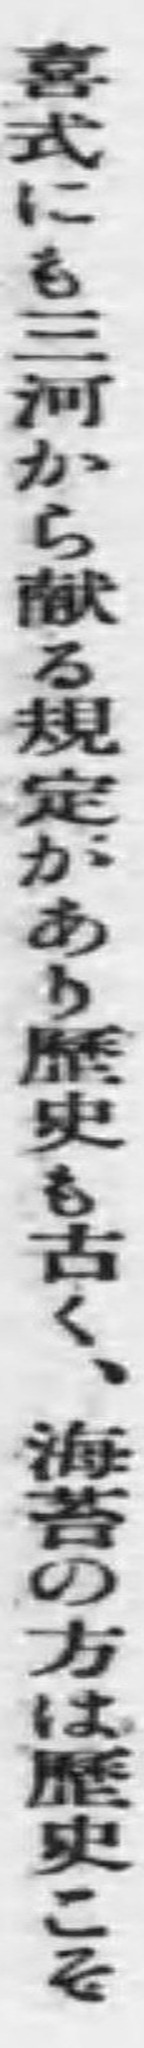喜式にも三河から献る規定があり歴史も古く、海苔の方は歴史こそ
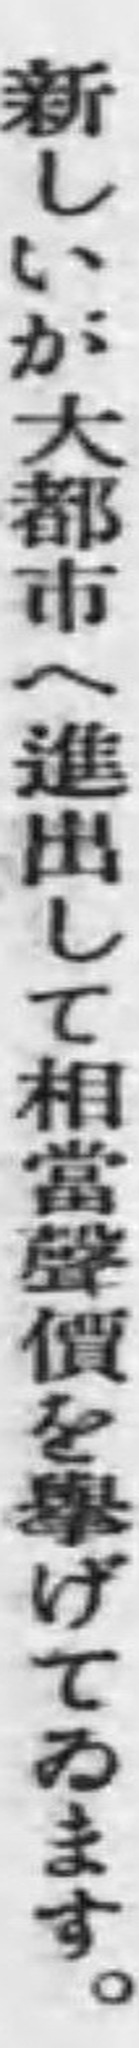新しいが大都市へ進出して相當聲價を挙げてゐます。
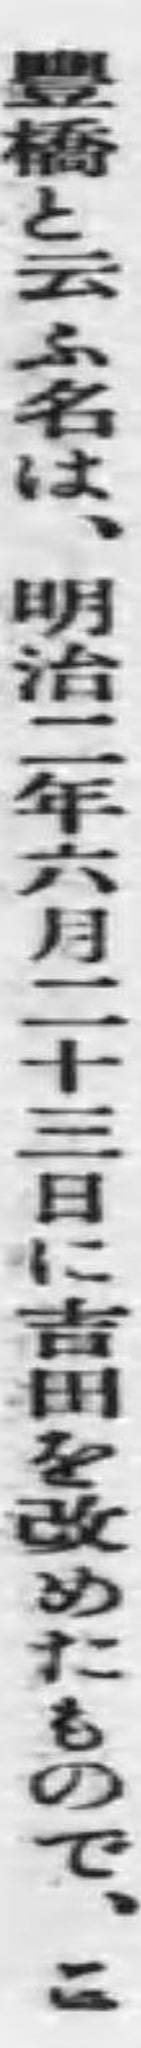豊橋と云ふ名は、明治二年六月二十三日に吉田を改めたもので、こ
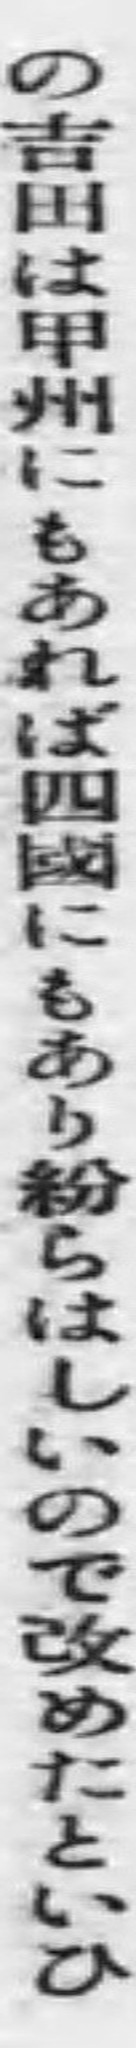の吉田は甲州にもあれば四國にもあり紛らはしいので改めたといひ
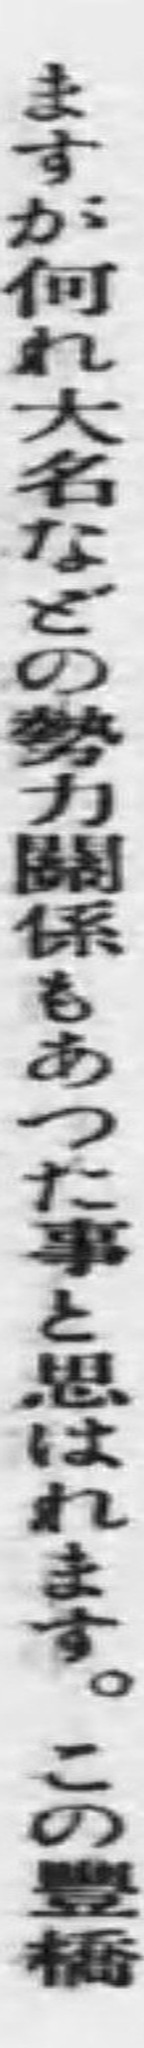ますが何れ大名などの勢力關係もあつた事と思はれます。この豊橋
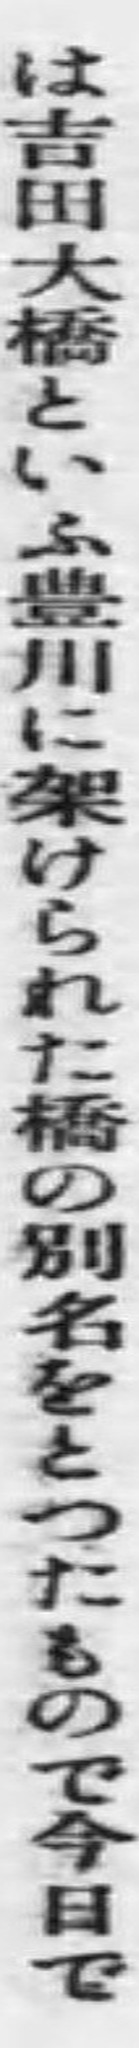は吉田大橋といふ豊川に架けられた橋の別名をとつたもので今日で
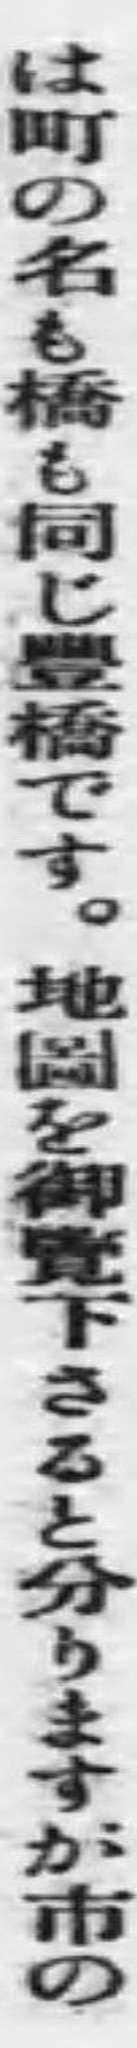は町の名も橋も同じ豊橋です。地圖を御覧下さると分りますが市の
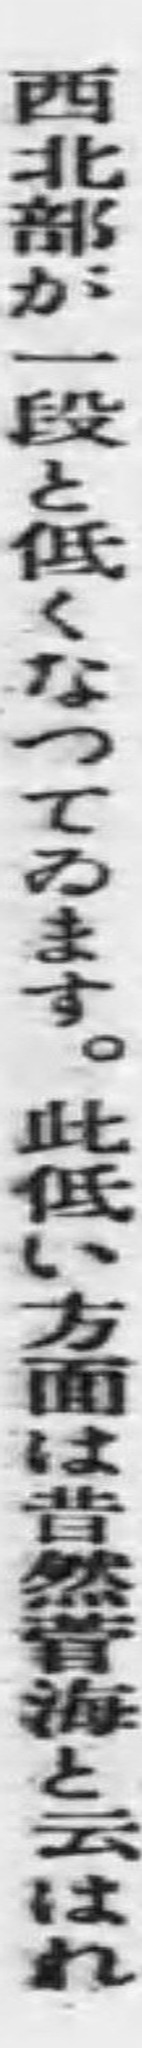西北部が一段と低くなつてゐます。此低い方面は昔然菅海と云はれ
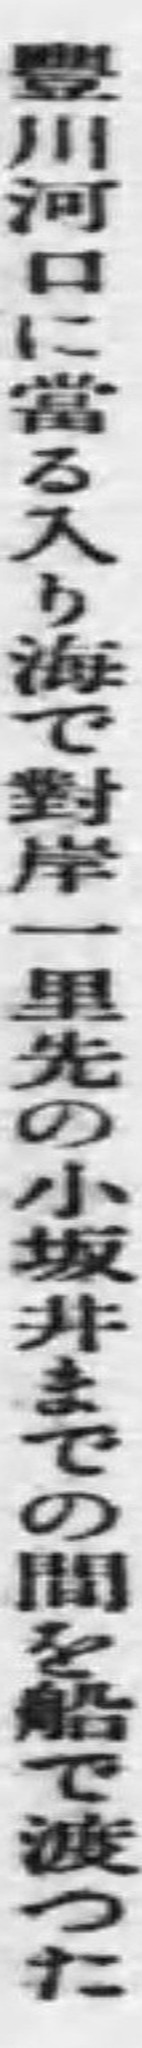豊川河口に當る入り海で對岸一里先の小坂井までの間を船で渡つた
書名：東三河道中記 : 豊橋市及其附近案内
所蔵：国立国会図書館 National Diet Library, JAPAN
